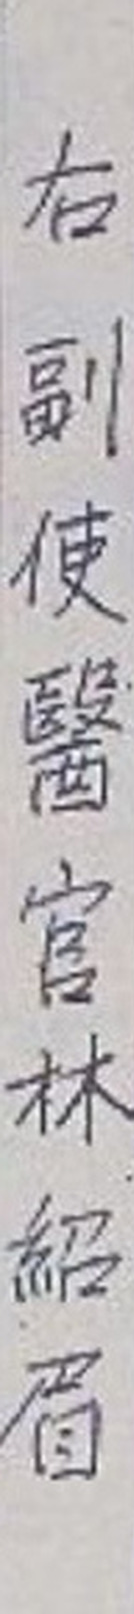右副使医官林紹眉
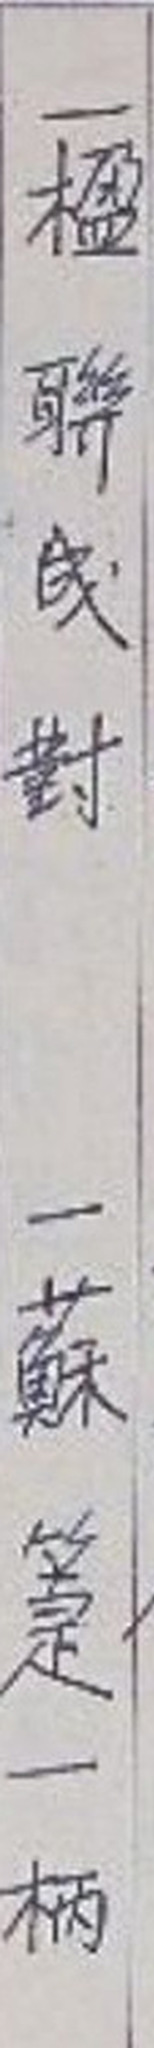一楹聯成対一蘇箑一柄
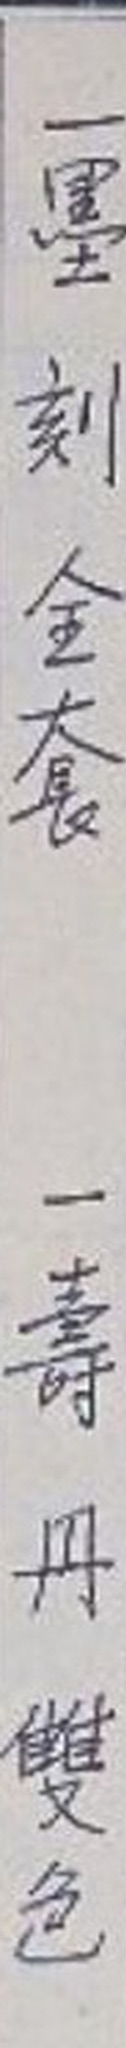一墨刻全套一寿丹雙色
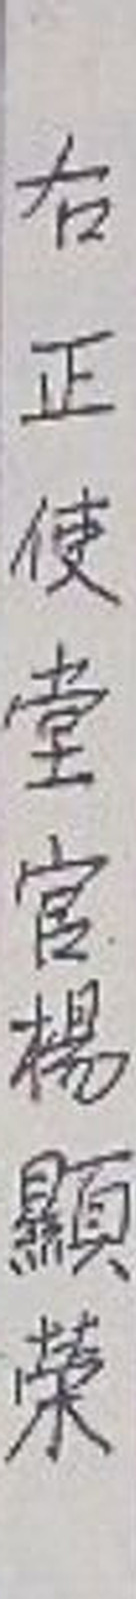右正使堂官楊顕栄
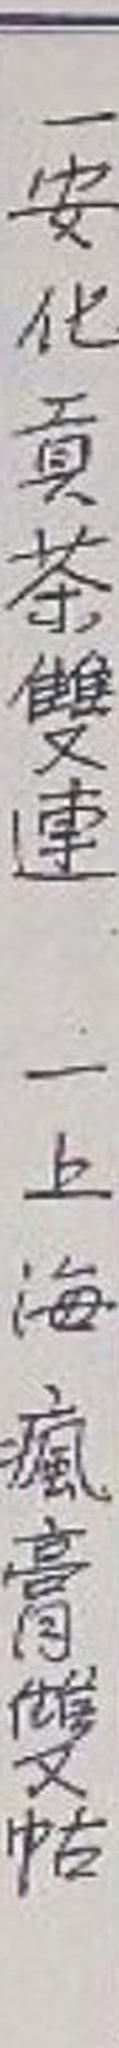一安化貢茶雙連一上海瘋膏雙帖
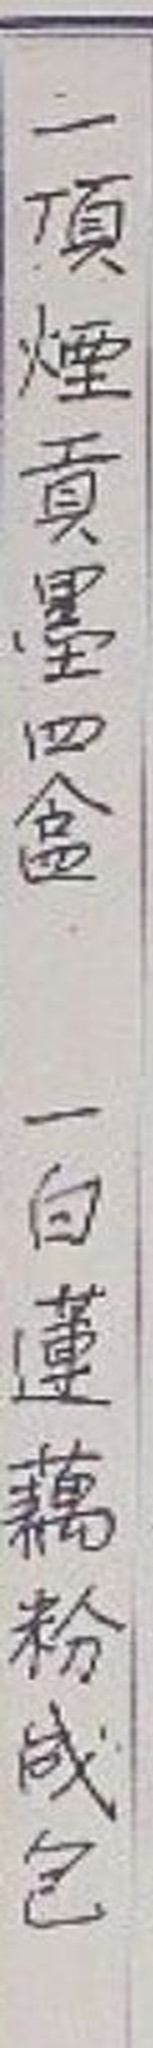一頂煙貢墨四盒一白蓮藕粉成包
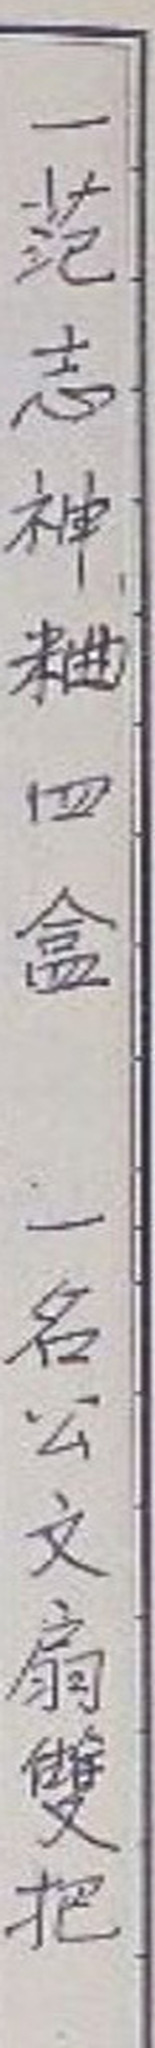一范志神粬四盒一名公文扇雙把
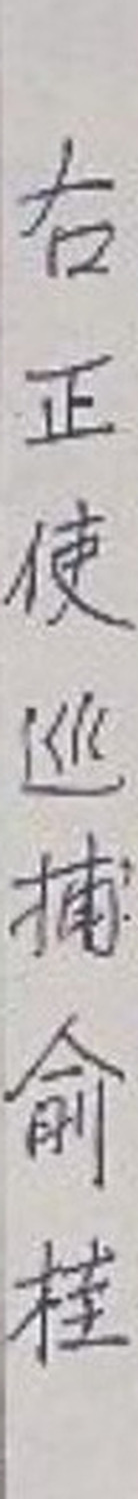右正使巡捕兪桂
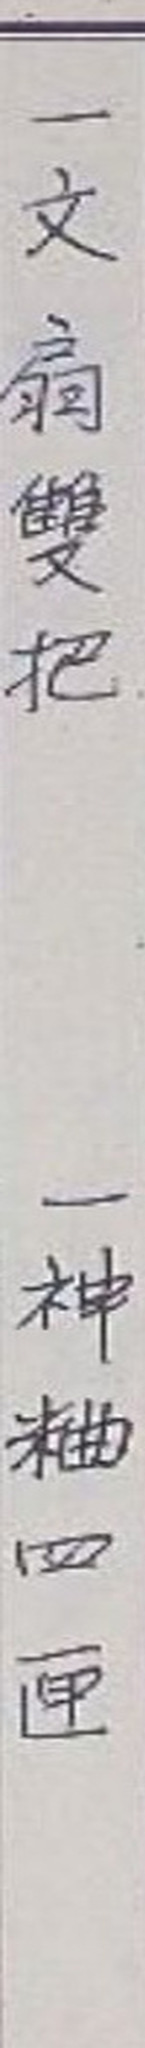一文扇雙把一神粬四匣
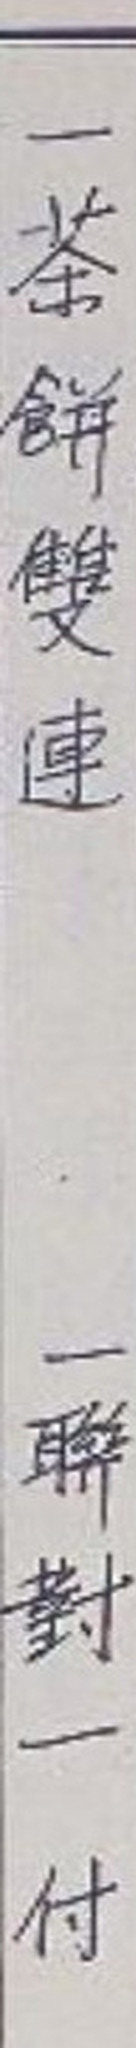一茶餅雙連一聯対一付
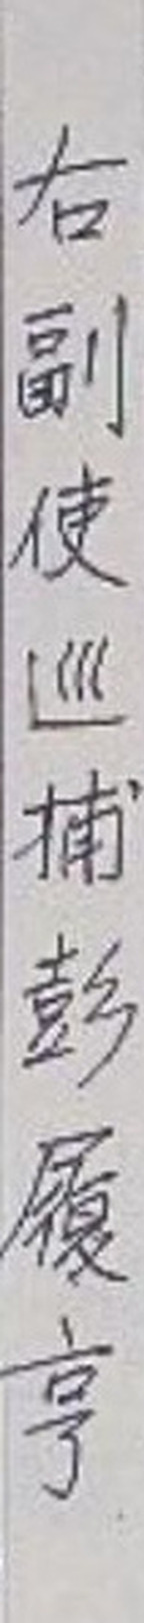右副使巡捕彭履亨
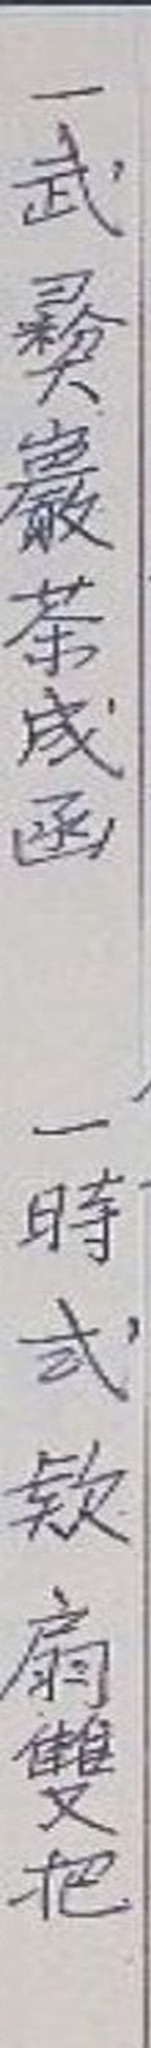一武彛巖茶成函一時式欵扇雙把
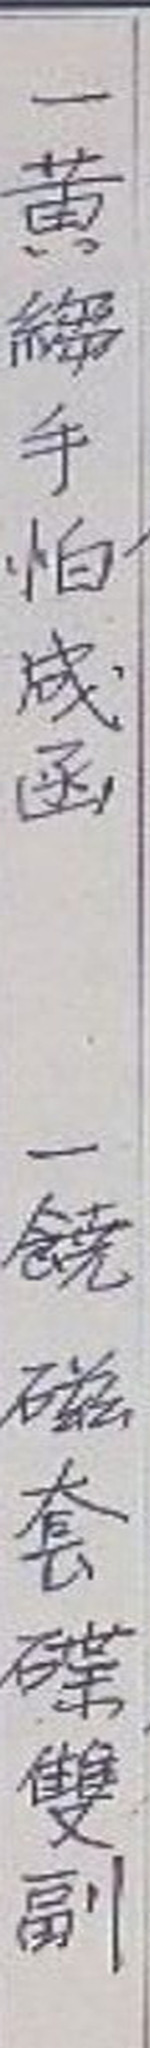一黄縐手怕成函一饒磁套碟雙副
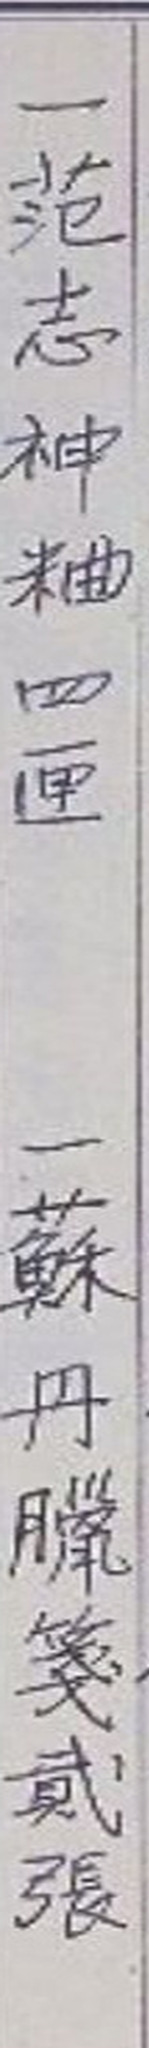一范志神粬四盒一蘇丹臘箋弐張
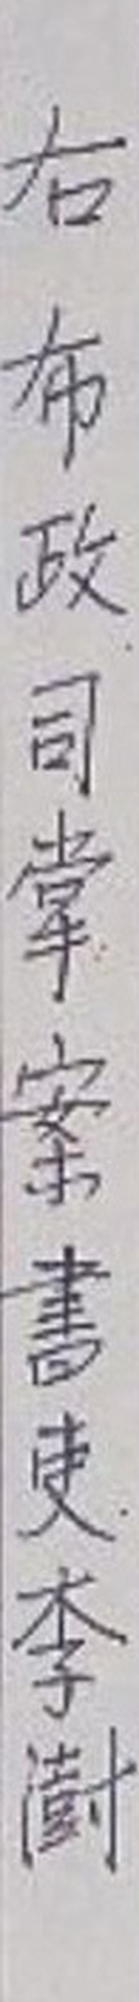右布政司掌案書吏李澍

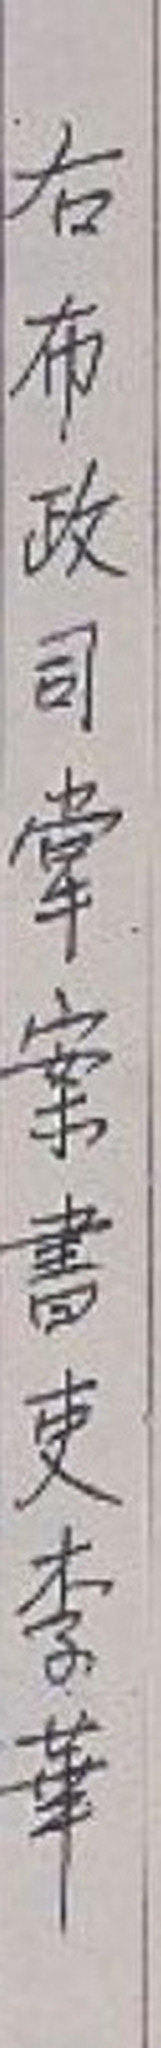右布政司掌案書吏李華
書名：支那冊封使来琉諸記 下巻
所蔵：University of the Ryukyus Library
